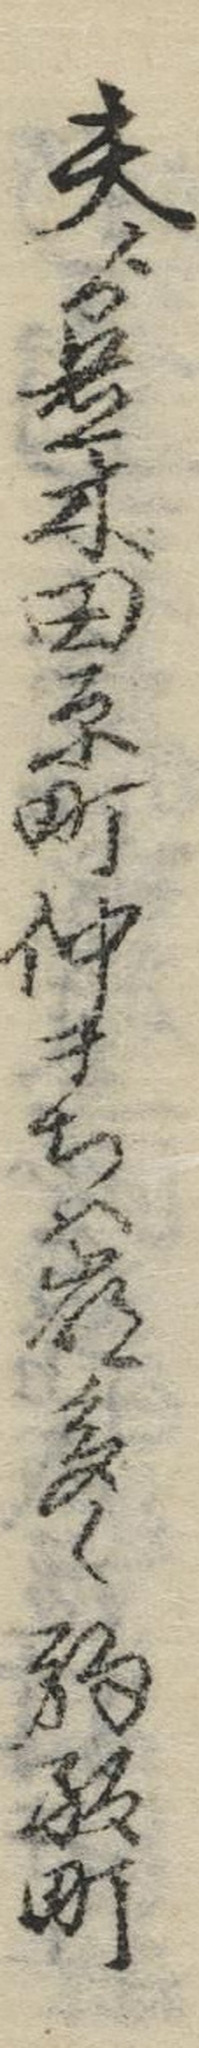夫ゟ益木田原町仲まちハ崩多く駒形町
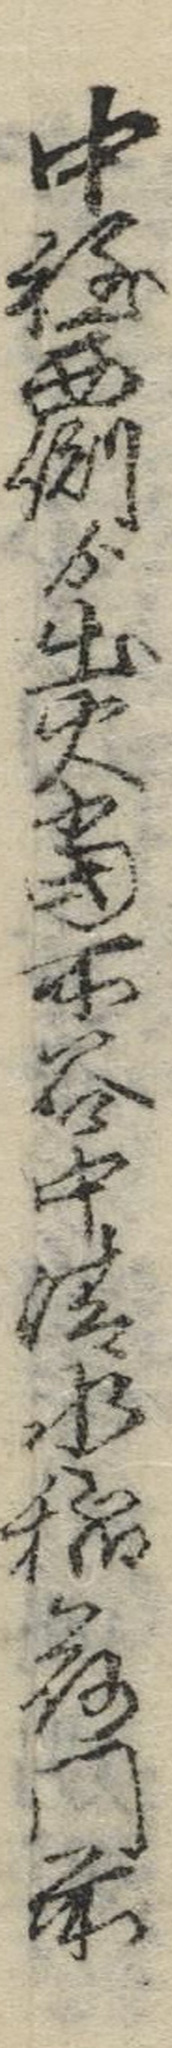中程西側ゟ出火当所谷中清水稲荷門前
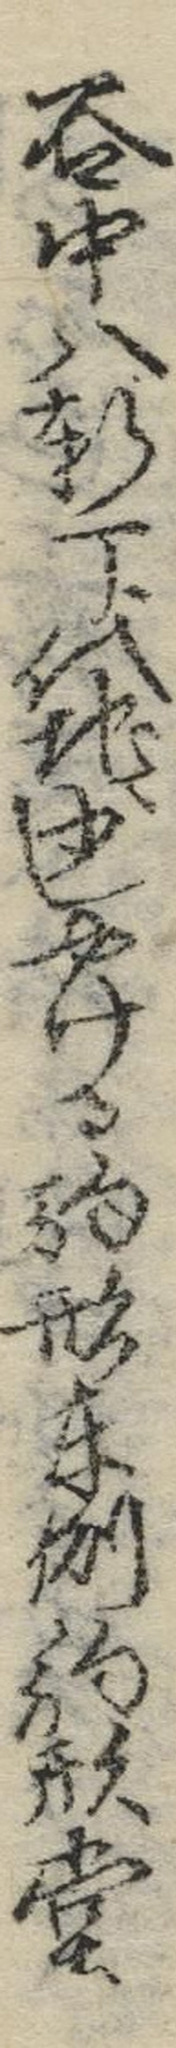谷中八軒下代地少しやける駒形東側駒形堂
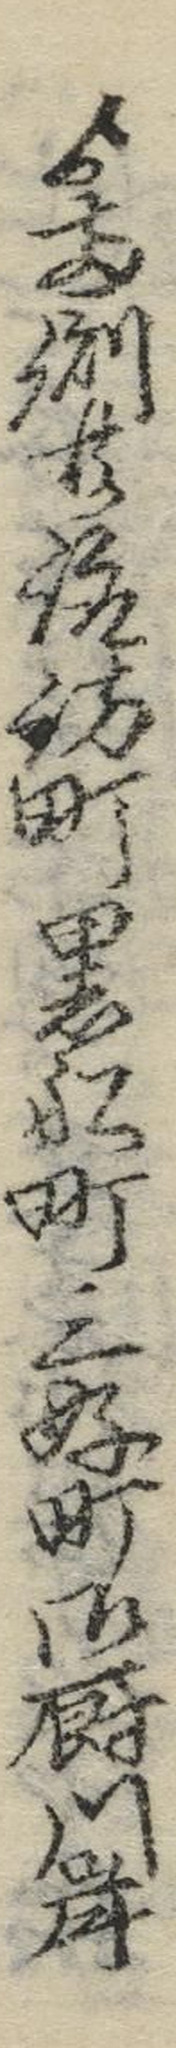ゟ両側共諏訪町黒船町三好町御厩川岸
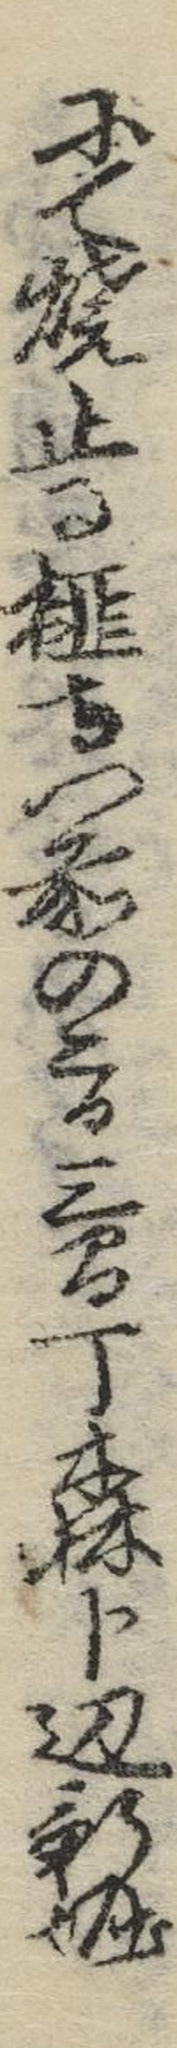にて焼止る榧寺門前のこる三間丁森下辺新堀
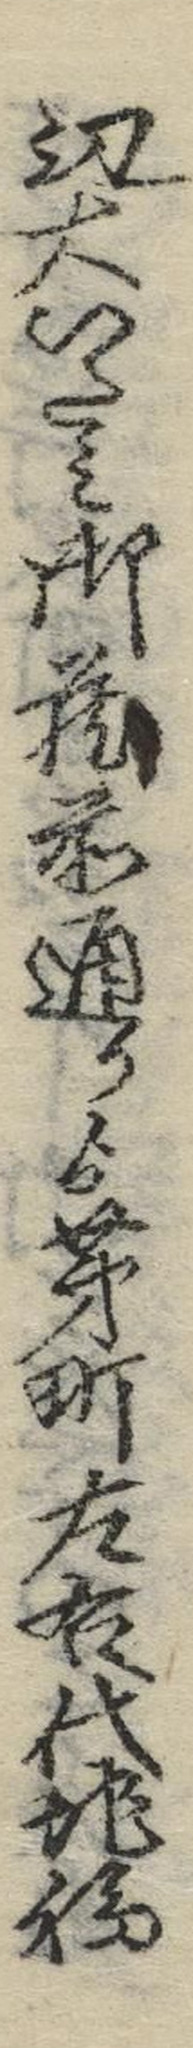辺大いたミ御蔵前通りゟ茅町左右代地福
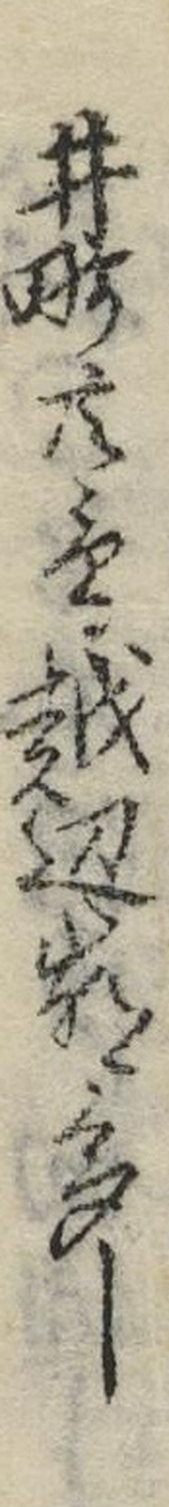井町共鳥越辺崩多し
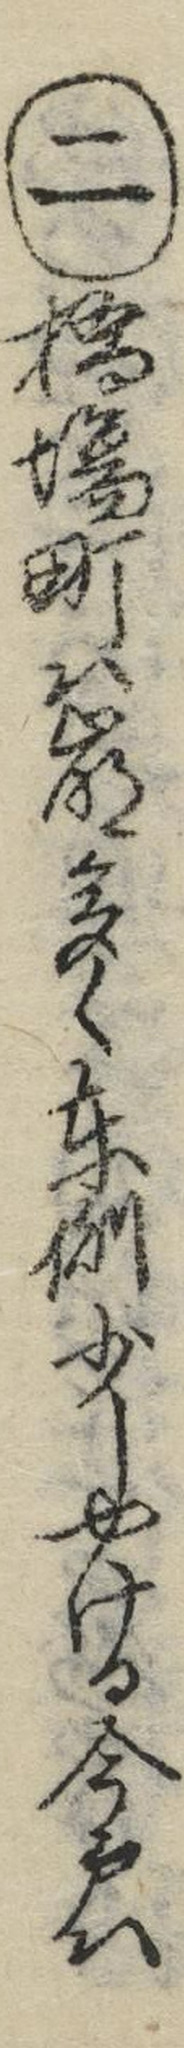二橋場町ハ崩多く東側少しやける今戸ハ
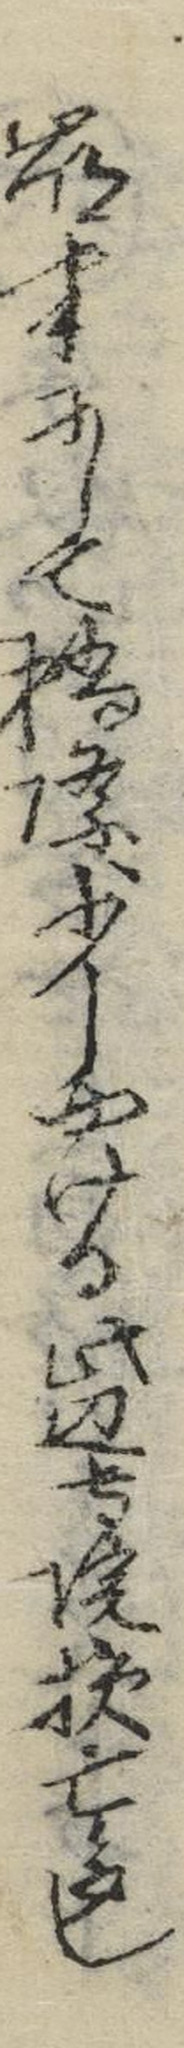崩半にして橋際少しやける此辺寺院損亡多し
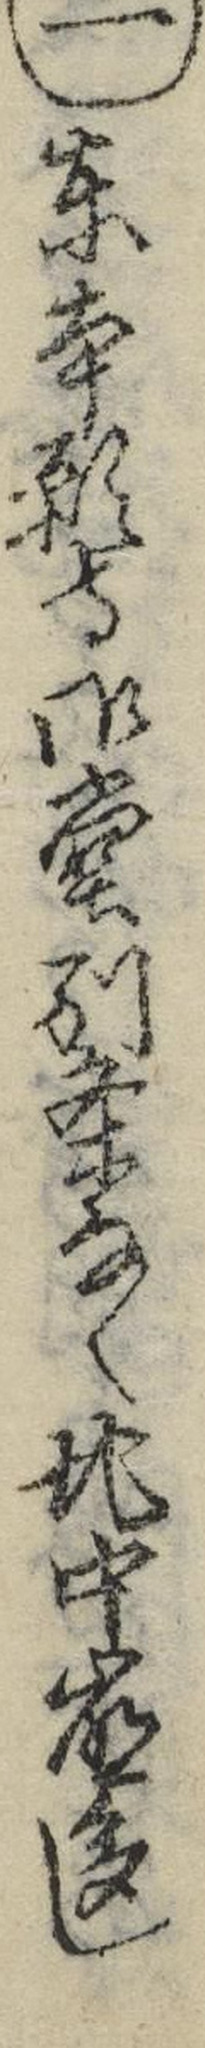三東本願寺御堂別条なく地中崩多し
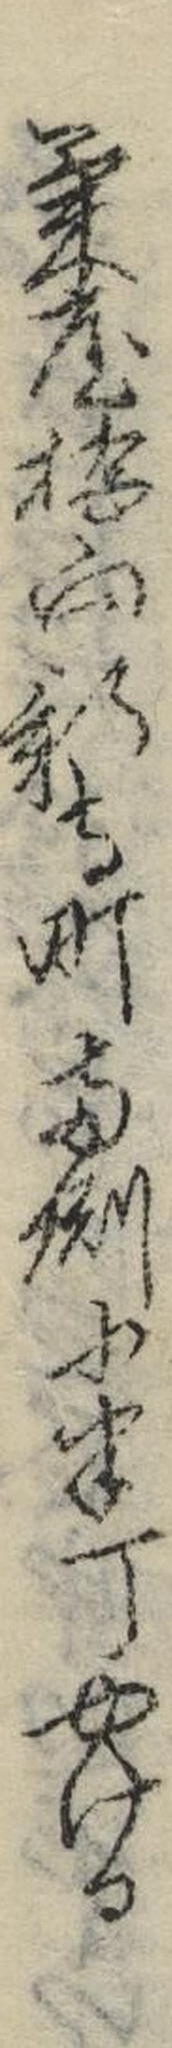萬屋橋向新寺町両側小半丁やける
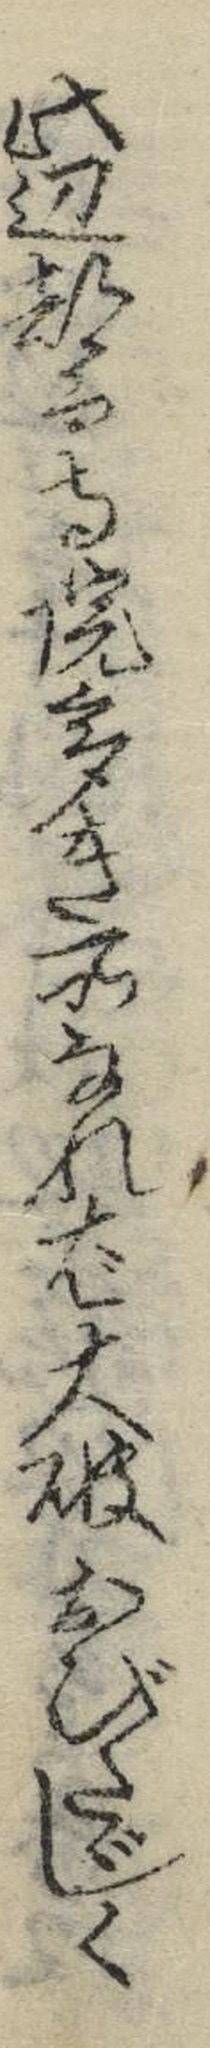此辺都而寺院多き所なれば大破おびたゞしく
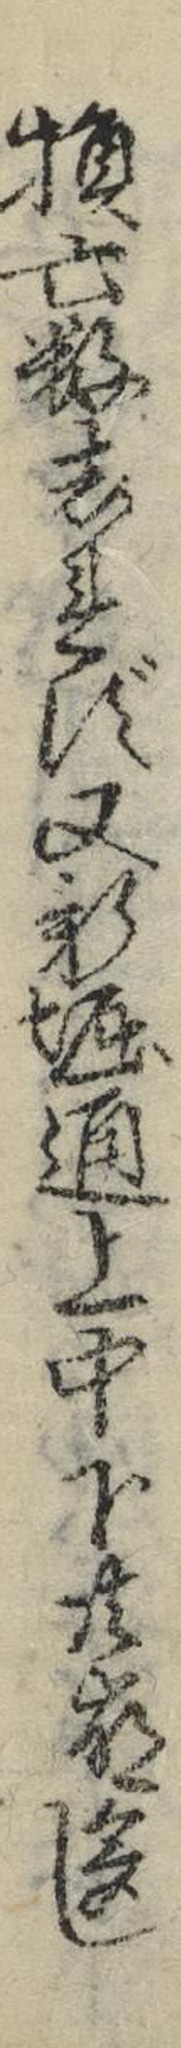損亡数しれず又新堀通上中下共崩多し

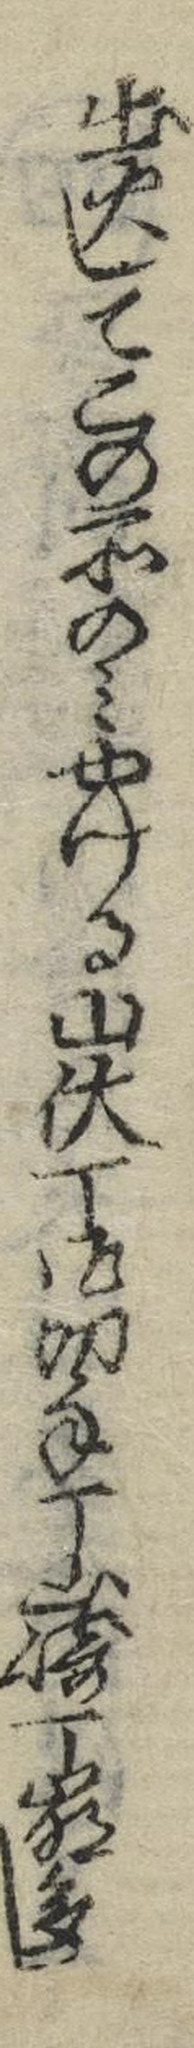出火してこの所のミやける山伏丁御切手丁山崎丁崩多し
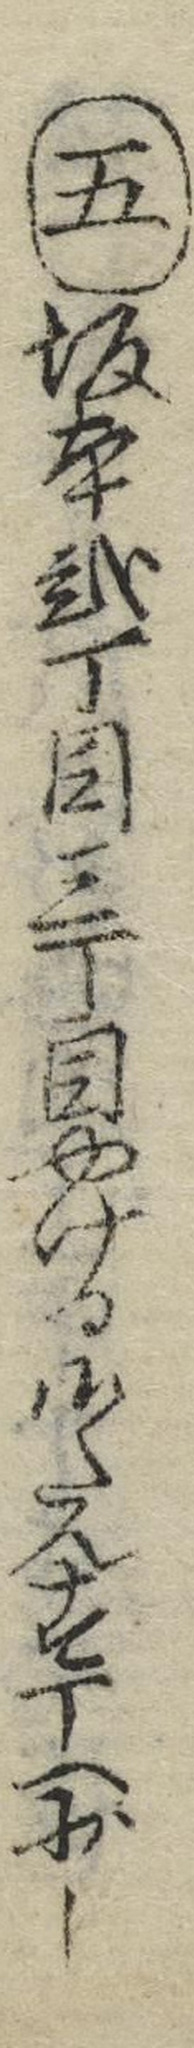五坂本弐丁目三丁目やける御たんす丁へ少し
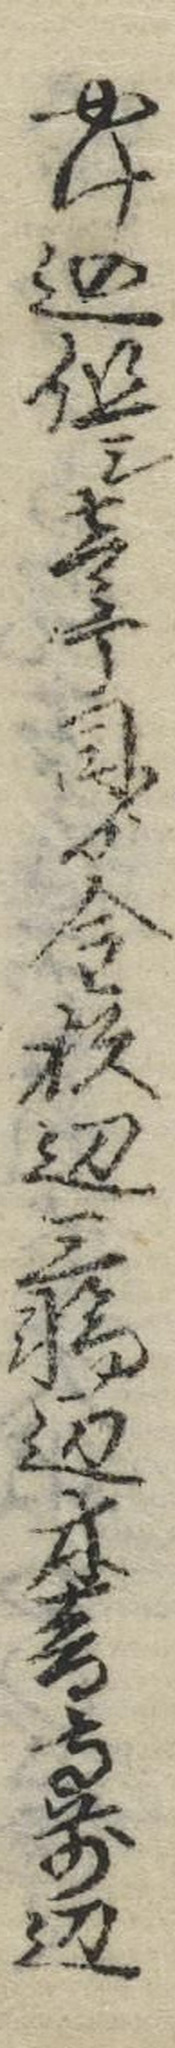やけ込但シ壱丁目ゟ金杉辺三輪辺木青寺前辺
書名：江戸御屋鋪方町方共　地震類焼場所巨細書之寫　潰家潰土蔵共取調附街道筋近在迄
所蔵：東京大学地震研究所図書室 Earthquake Research Institute Library, The University of Tokyo, JAPAN
